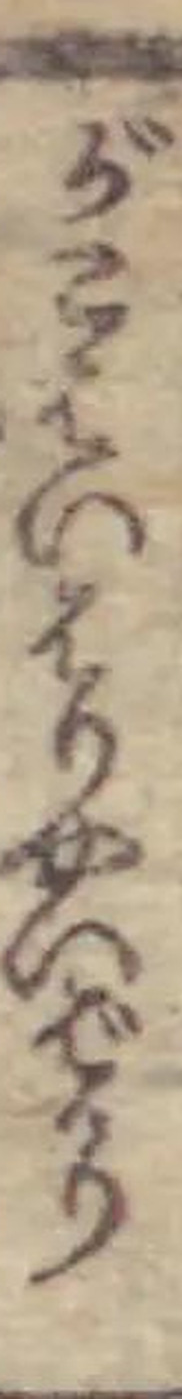がこはいはりやいばかり
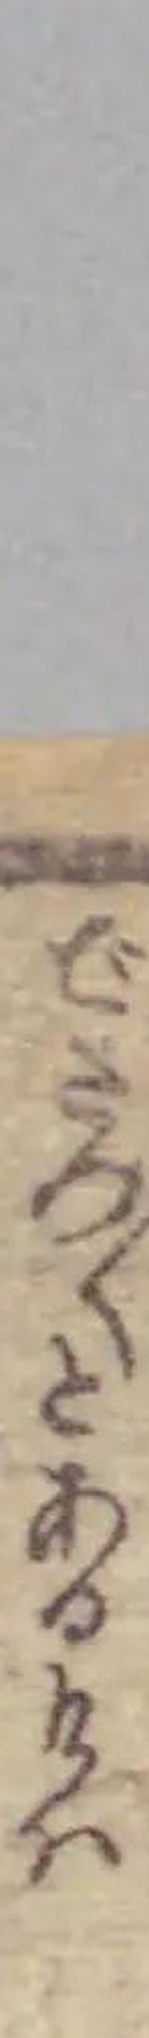でさつ〳〵とあるけは
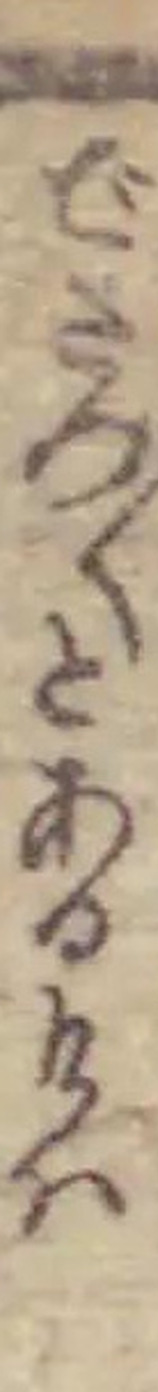でさつ〳〵とあるけは
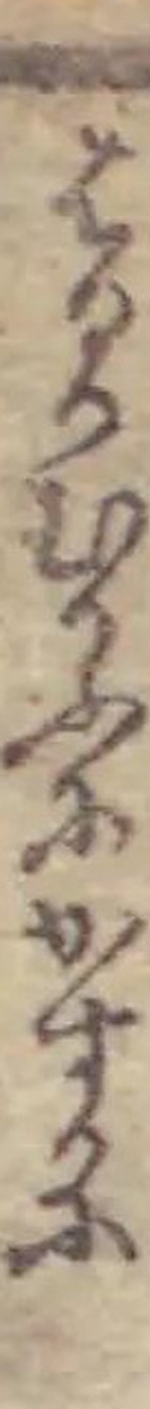はるかむかふにかすかに
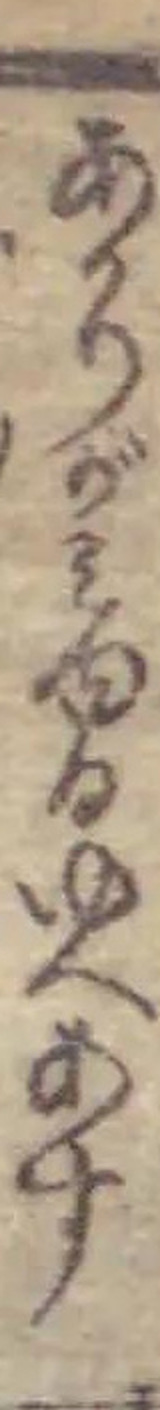あかりがみゆるへあす
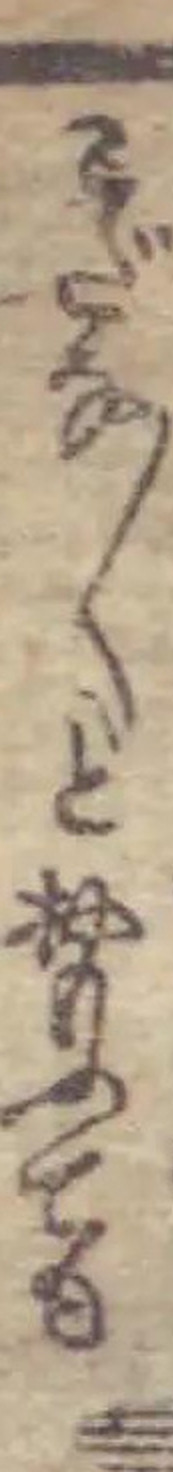こだな〳〵とおもふても
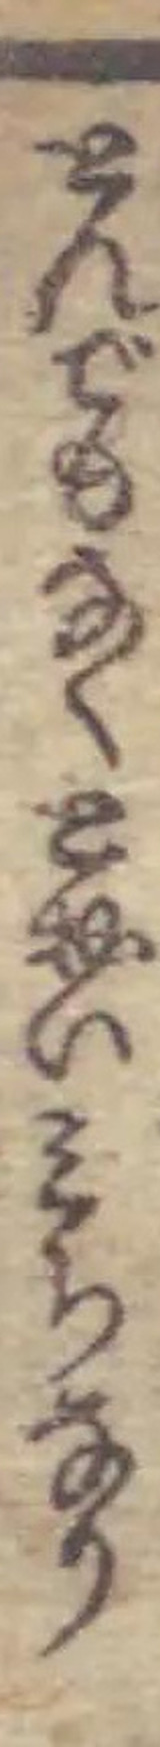とんでもなくとおいみちなり

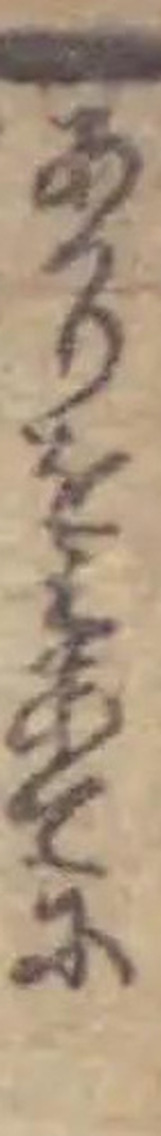あかりをみあてに
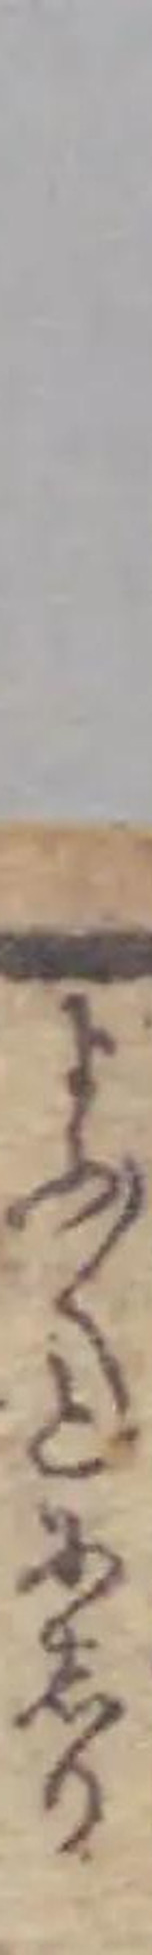よふ〳〵とにしり
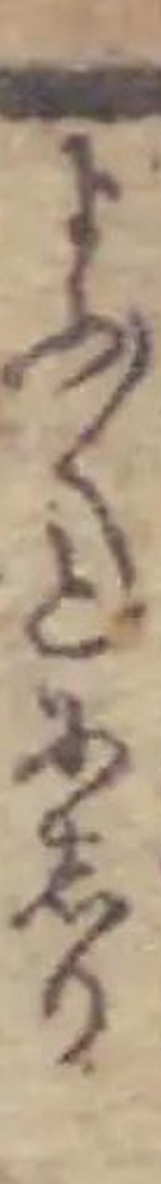よふ〳〵とにしり
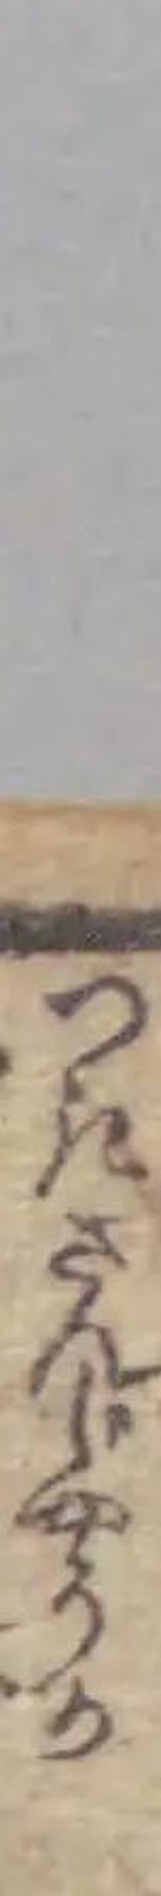つきさんじや？うか
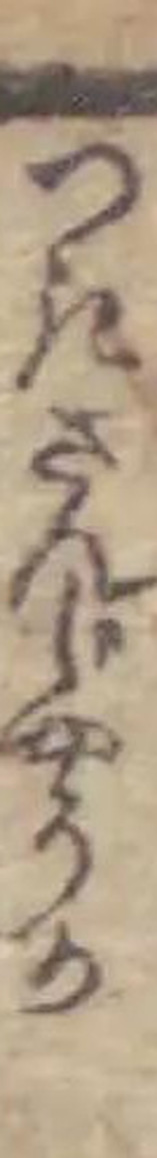つきさんじや？うか
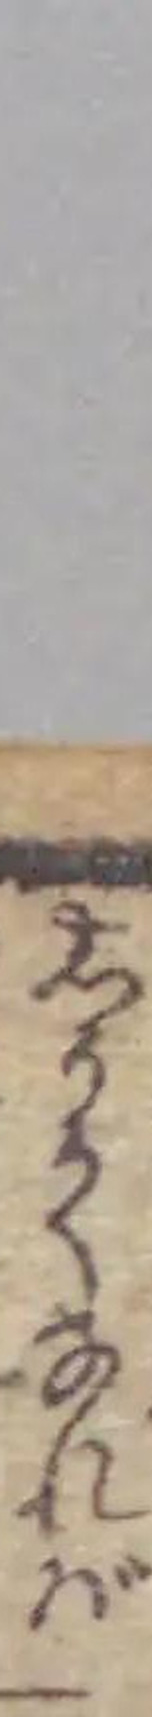しうかくなれば
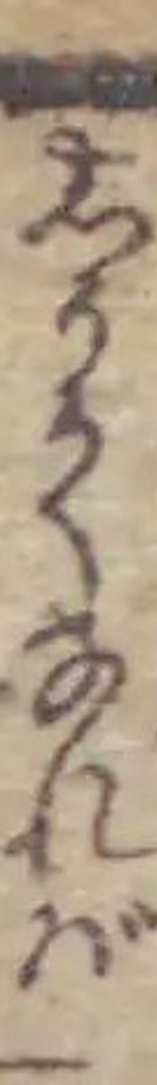しうかくなれば
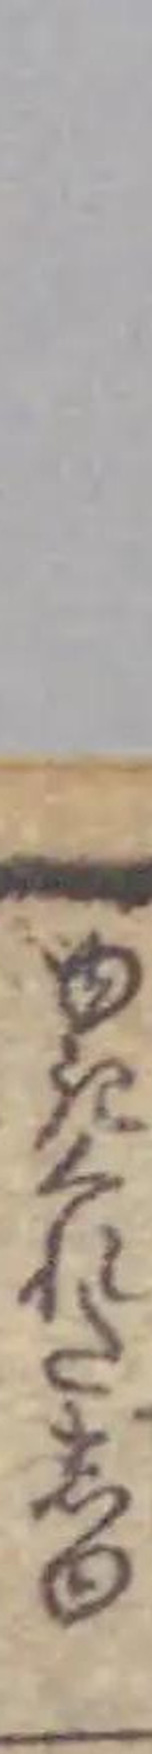ゆきくれたしゆ
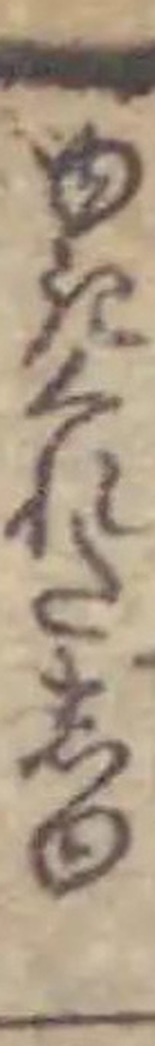ゆきくれたしゆ
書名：もふもふもふ怖噺 2巻
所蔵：国立国会図書館 National Diet Library, JAPAN
